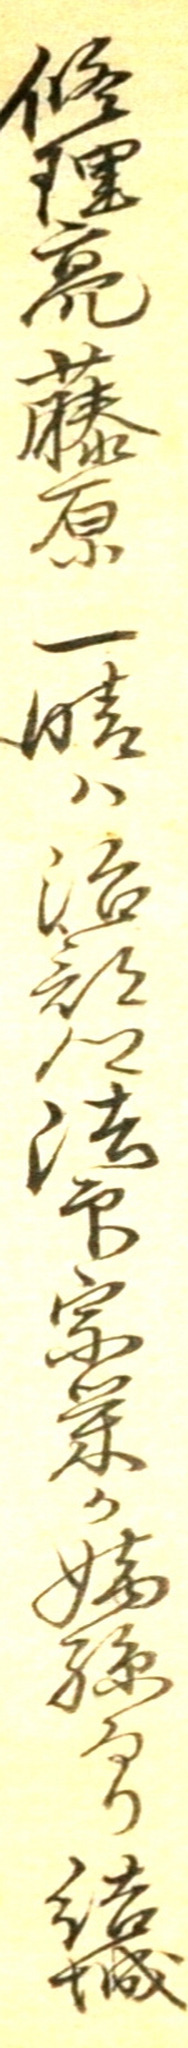修理亮藤原一晴は治部卿法印宗栄か嫡孫なり結城
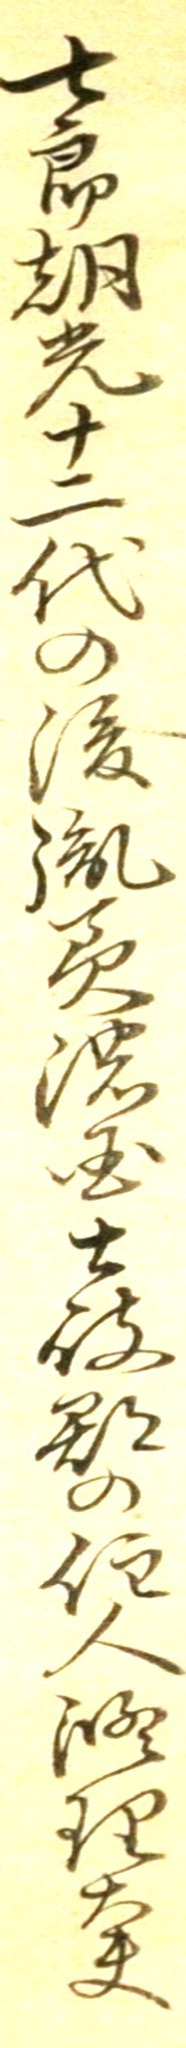七郎朝光十二代の後胤美濃国土岐郡の住人修理大夫
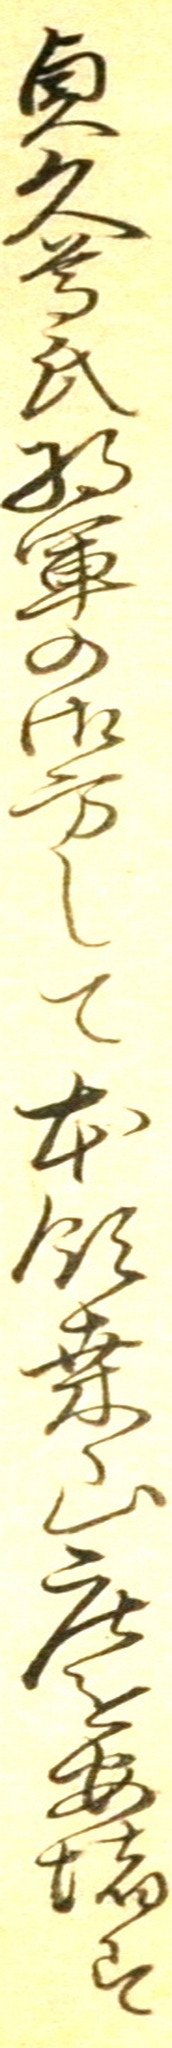貞久尊氏将軍の御方して本領桑山庄を安堵す
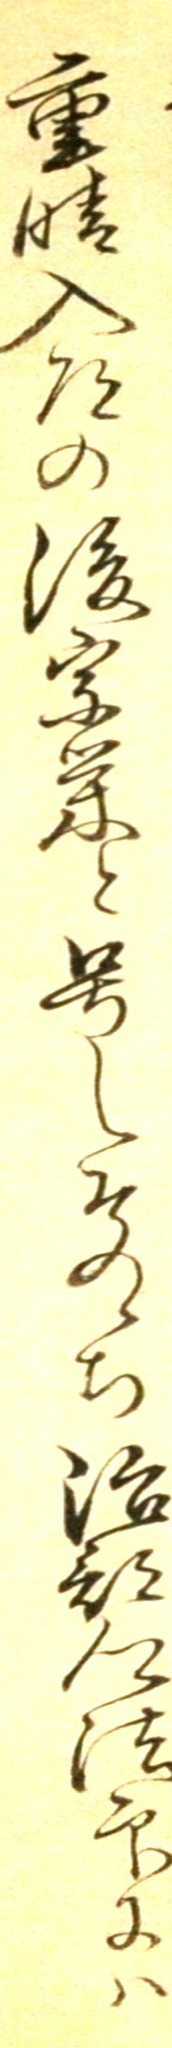重晴入道の後宗栄と号しそのゝち治部卿法印には
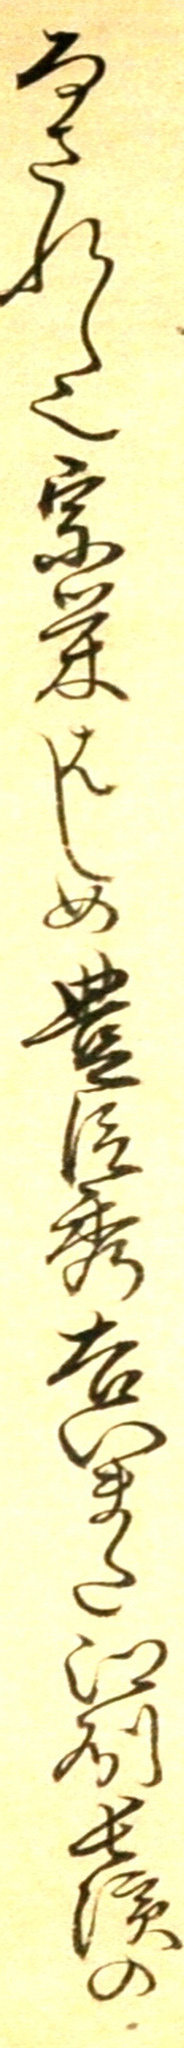なされし也宗栄はしめ豊臣秀吉いまた江州長浜の
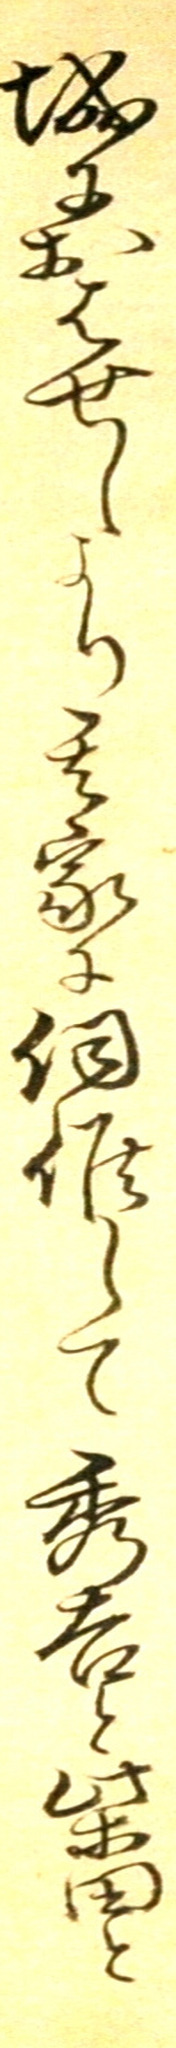城におはせしより其家に伺候して秀吉と柴田と
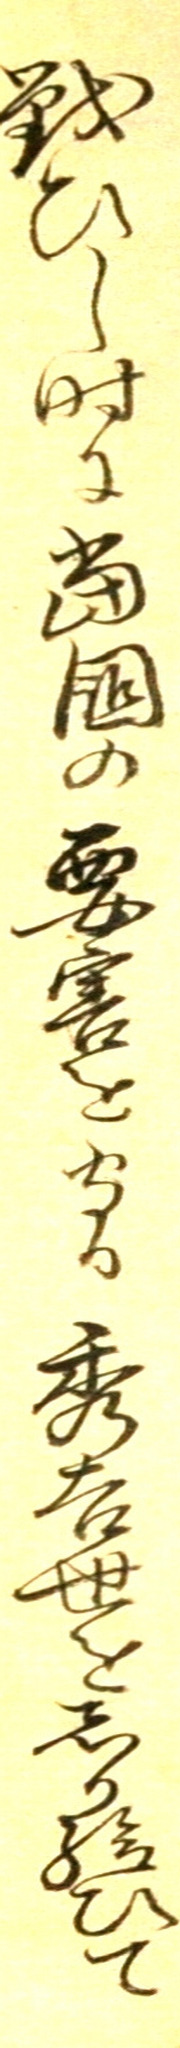戦ひし時に当国の要害を守る秀吉世をしり給ひて

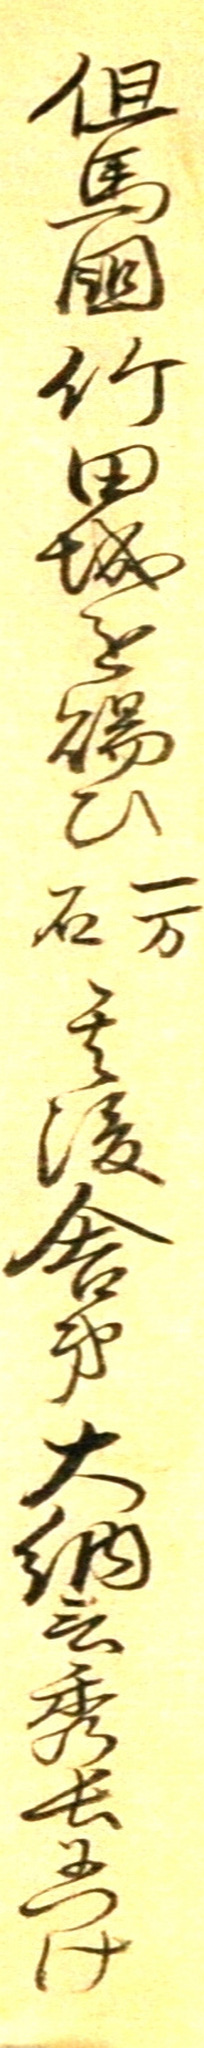但馬国竹田城を賜ひ一万石其後舎弟大納言秀長につけ
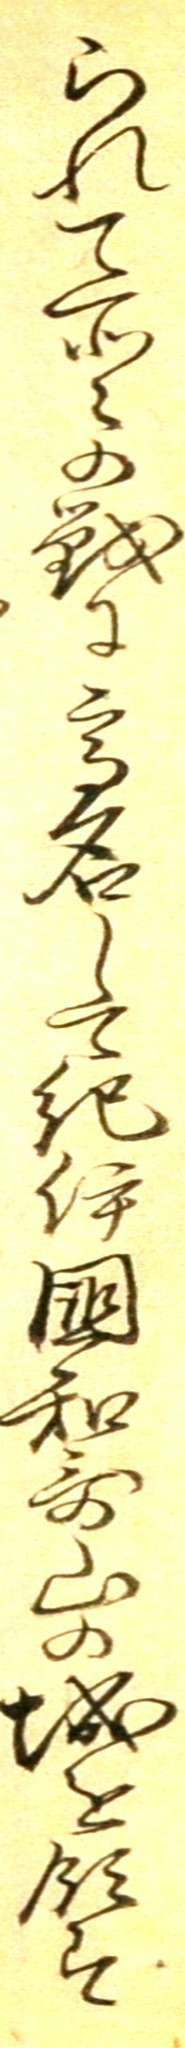られて所々の戦に高名して紀伊国和哥山の城を領す
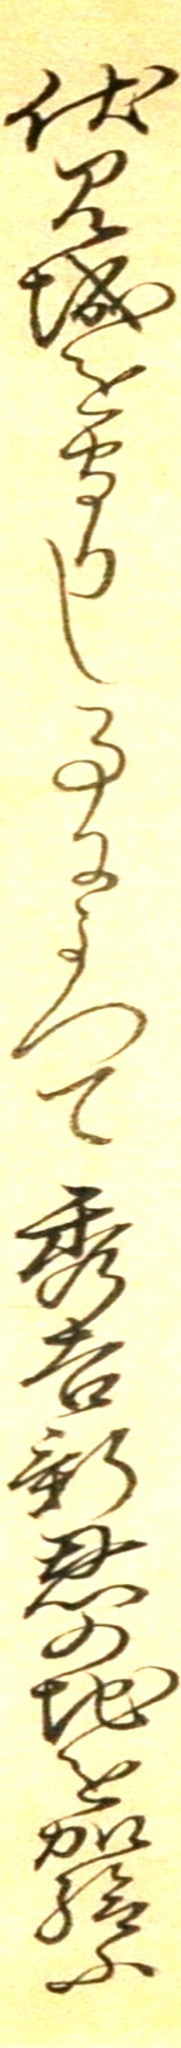伏見城を守りし事によつて秀吉新恩の地を加給ふ
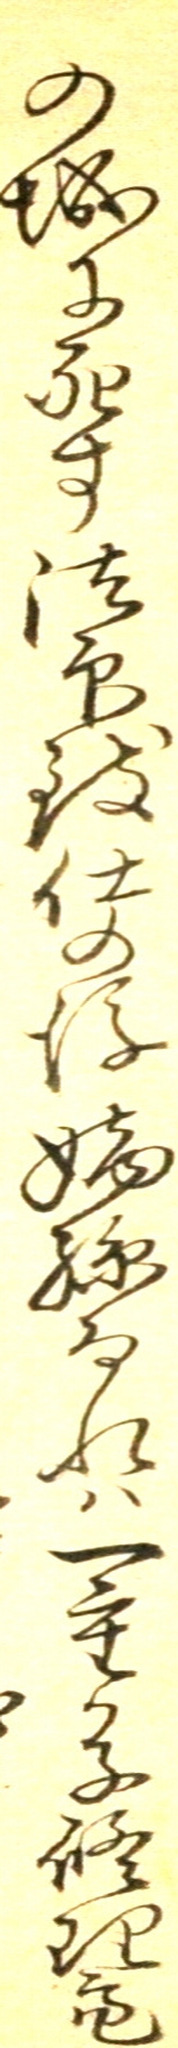の城に死す法印致仕の後嫡孫なれは一重か子修理亮
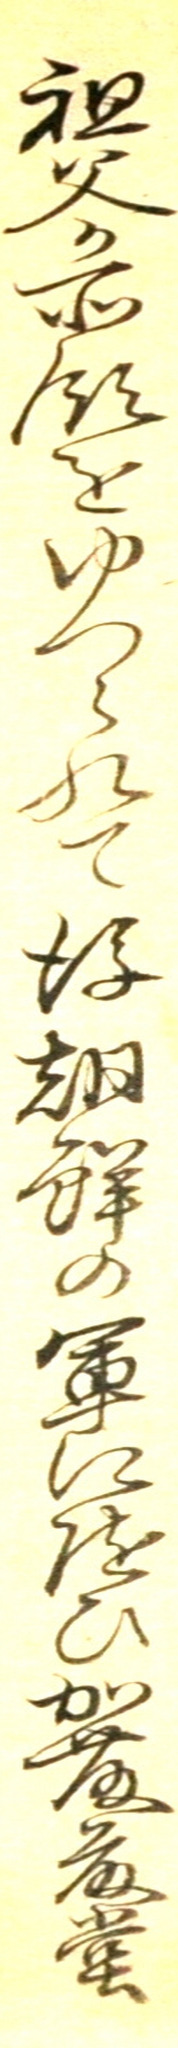祖父か所領をゆつられて後朝鮮の軍に随ひ加藤藤堂
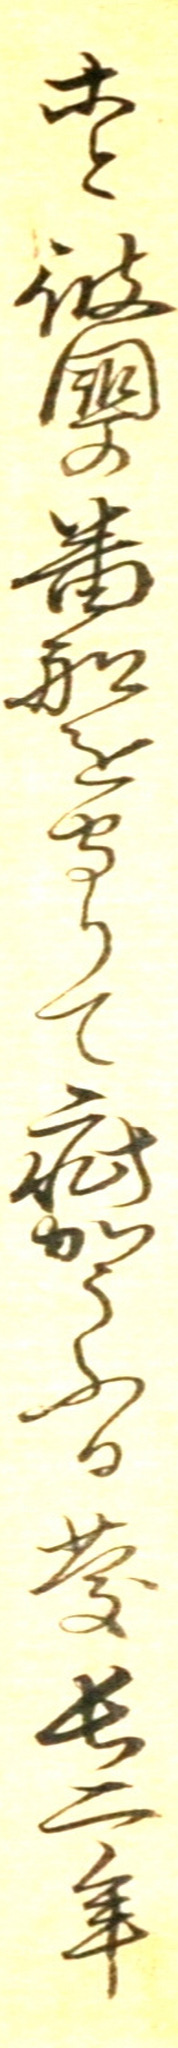等と彼国の番船を守りて疵かうふる慶長二年
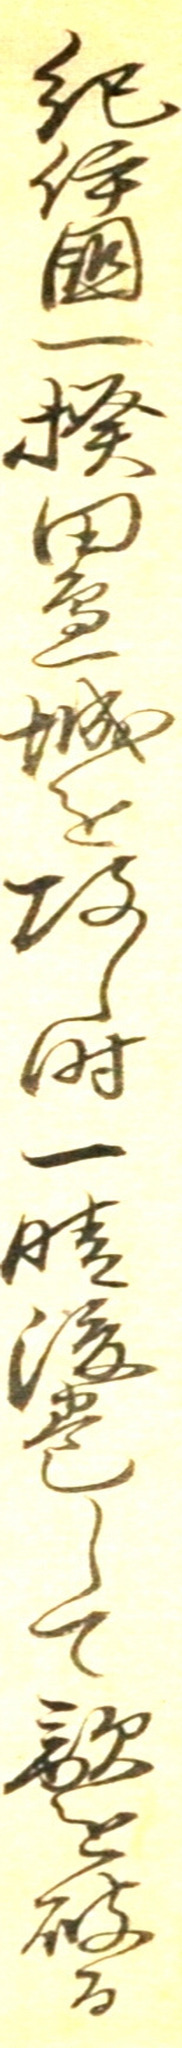紀伊国一揆田辺城を攻し時一晴後巻して敵を破る
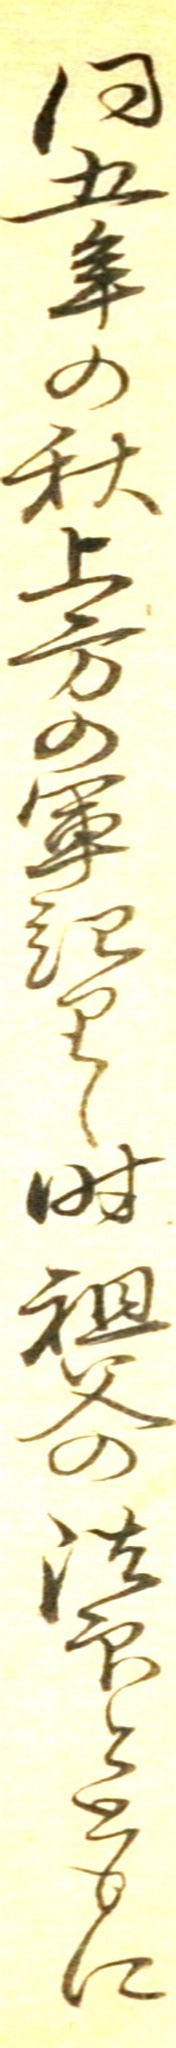同五年の秋上方の軍起りし時祖父の法印とともに
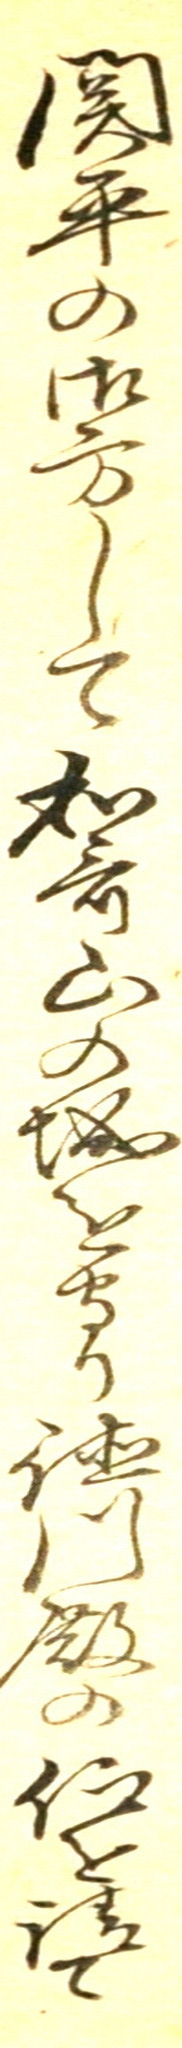関平の御方して和哥山の城を守り徳川殿の仰を請て
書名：藩翰譜（九・上）
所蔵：伊那市立高遠町図書館・合同会社AMANE
